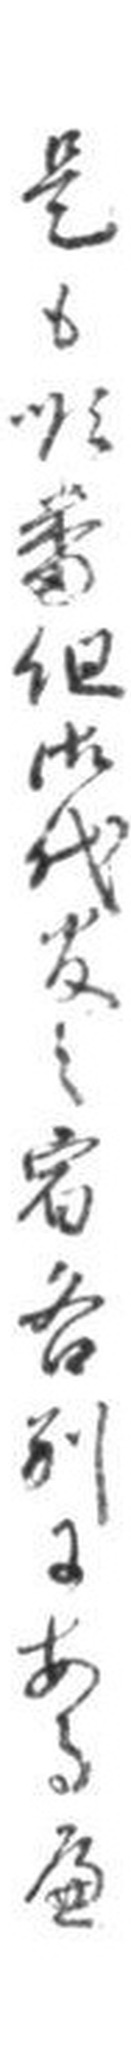是も順番但御代官之宿各別にあるへ
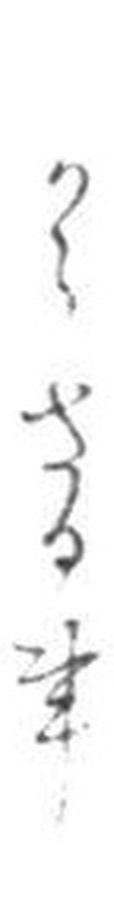からさる事
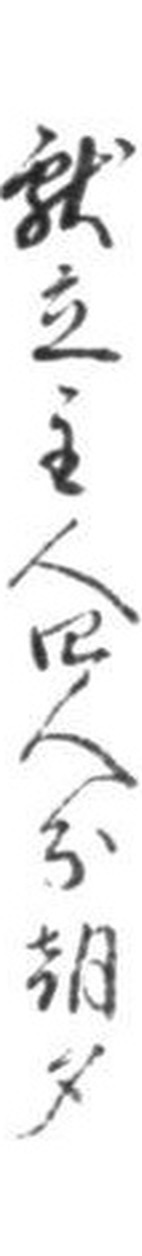献立主人四人分朝夕
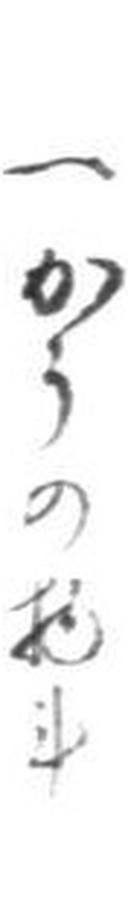一かうの物斗
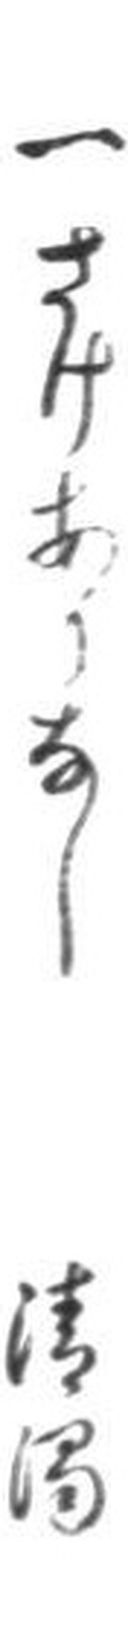一さけあうなし清濁
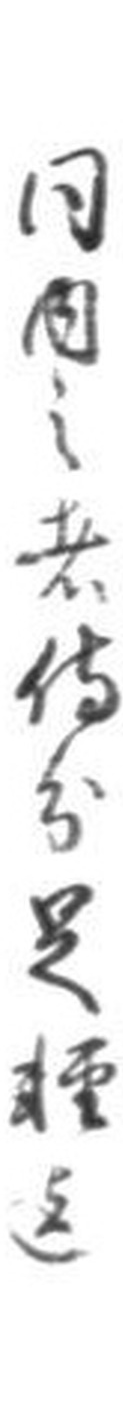同内之者侍分足軽迄

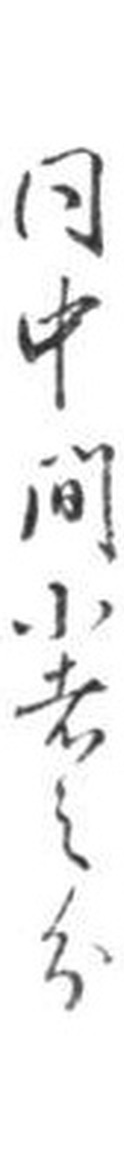同中間小者之分
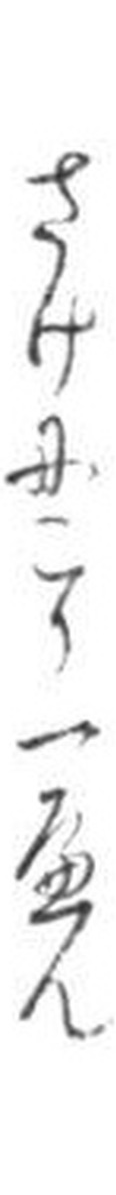さけにこり一へん
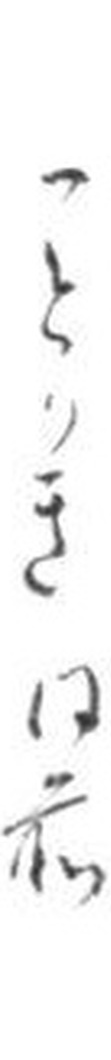ことりき同前
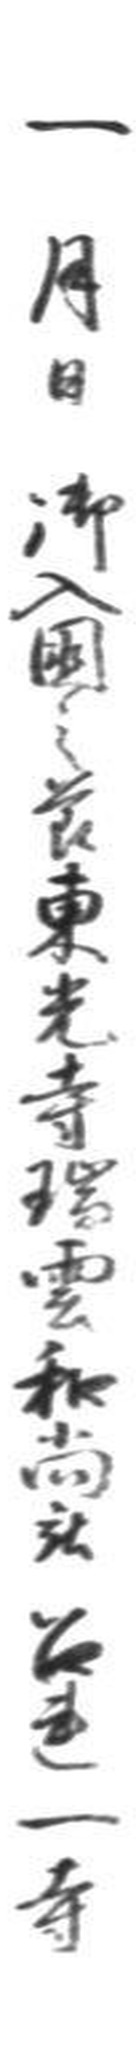一月日御入国之節東光寺瑞雲和尚被召連一寺
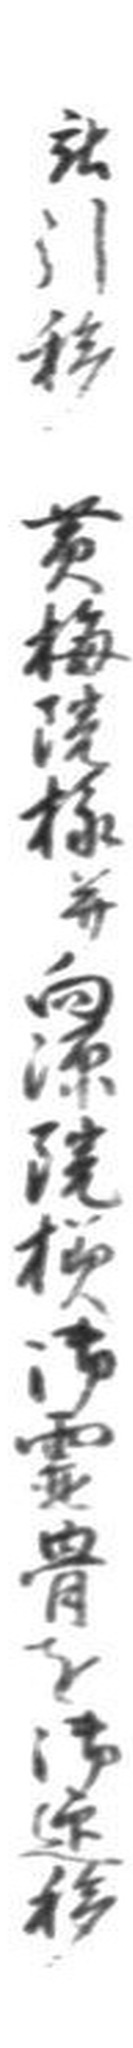被引移黄梅院様并向源院様御霊骨を御迎移
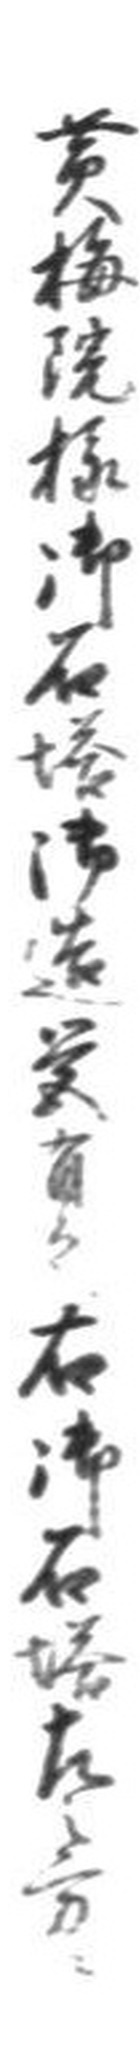黄梅院様御石塔御造営有之右御石塔左之方ニ
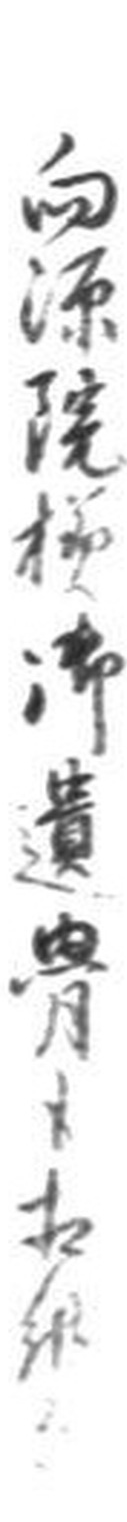向源院様御遺骨も相納之
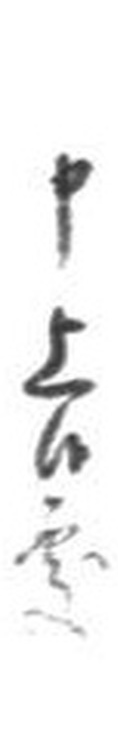申上候処
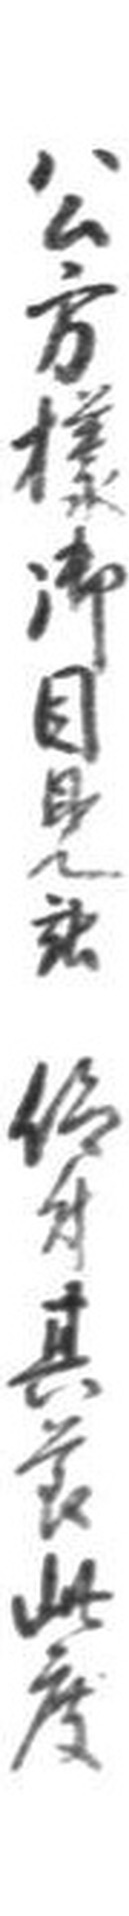公方様御目見被仰付其節此度
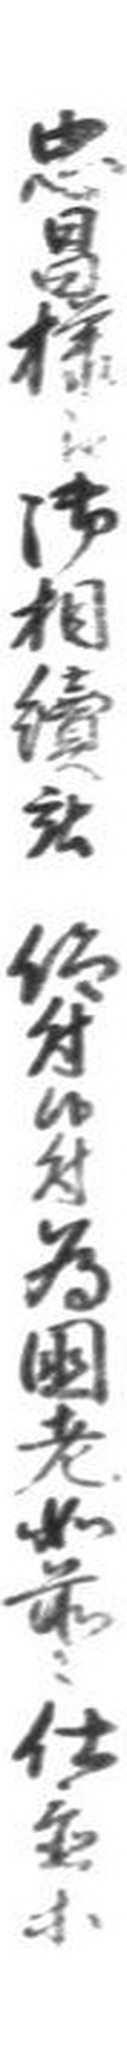忠昌様江御相続被仰付候付為国老如前々仕置等
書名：家譜 三 忠昌公 従慶長八年到寛永六年
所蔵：福井県文書館 Fukui Prefectural Archives
